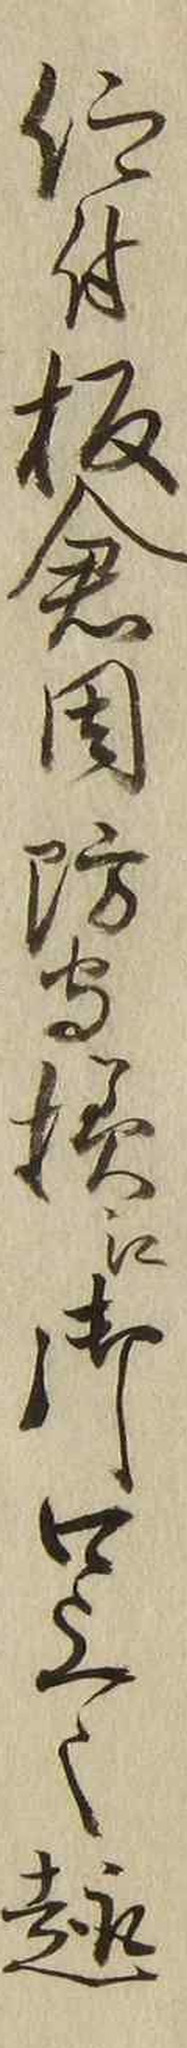仰付板倉周防守様江御口上之趣
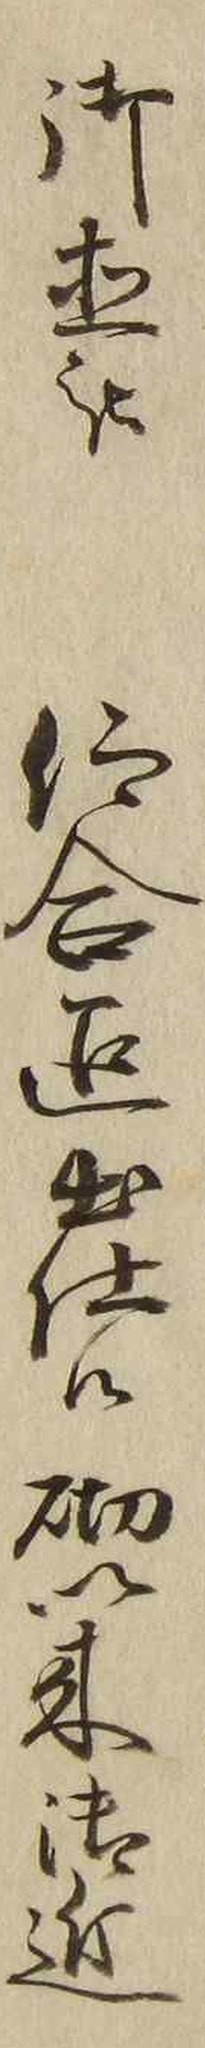御直被仰合迄出仕候砌以来御近

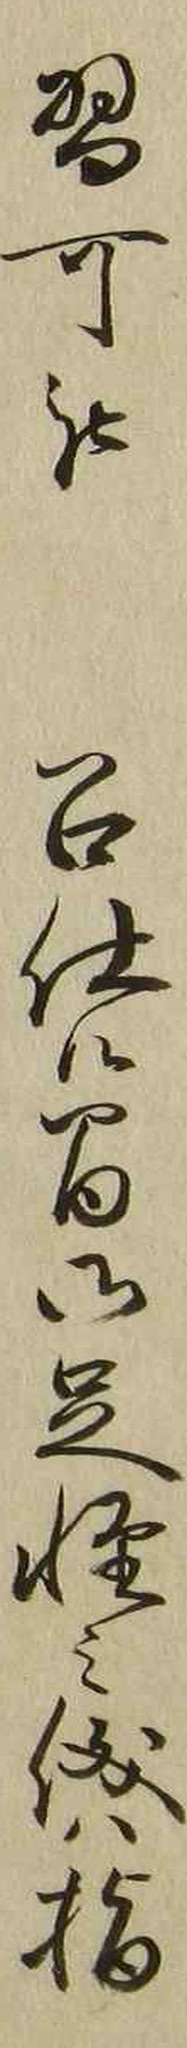習可被召仕候間御足軽之儀ハ指
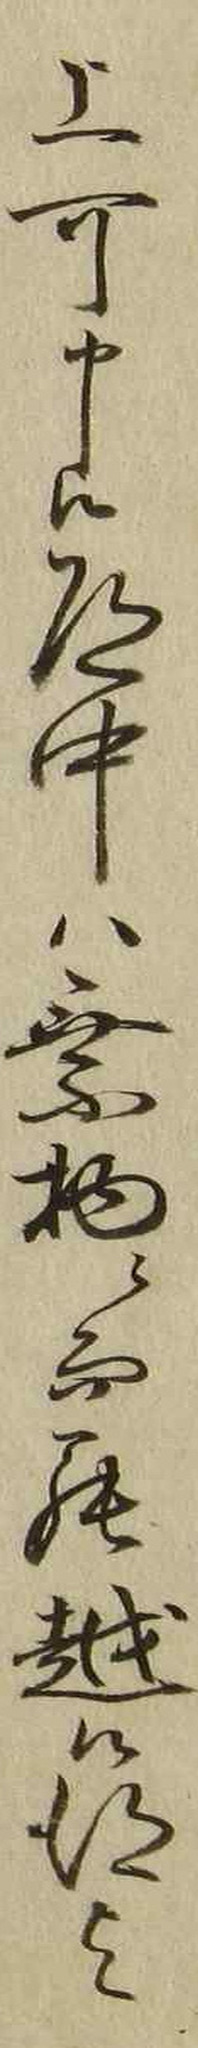上可申候道中ハ乗物ニ而罷越候得与
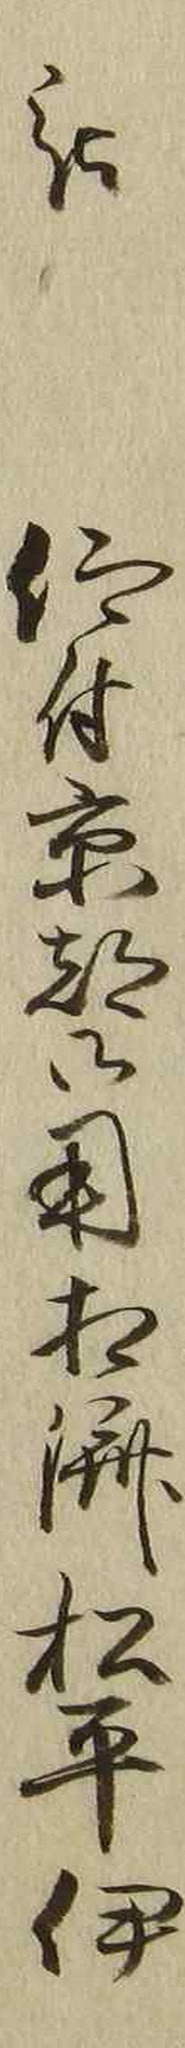被仰付京都御用相済松平伊
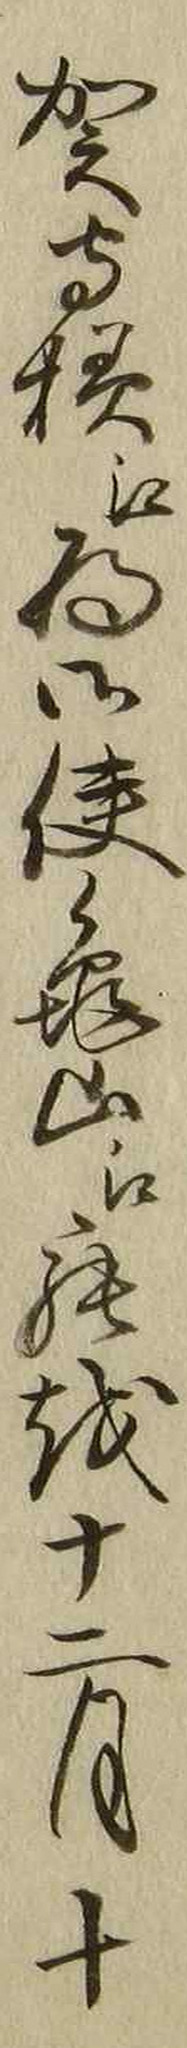賀守様江為御使亀山江罷越十二月十
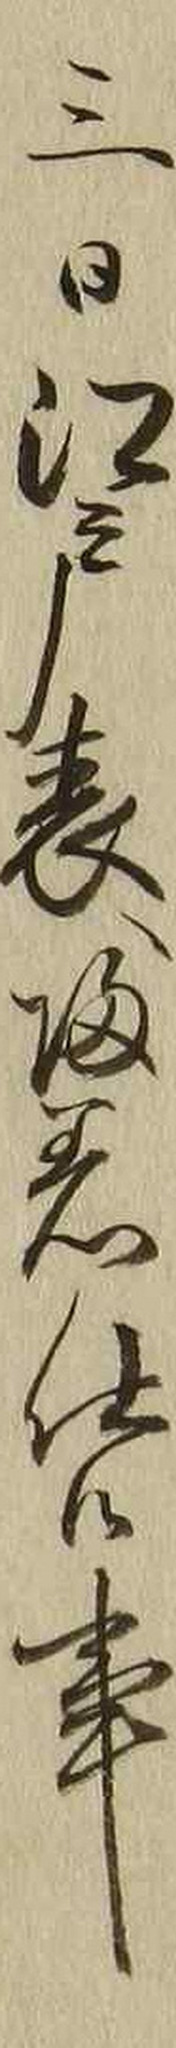三日江戸表へ帰着仕候事
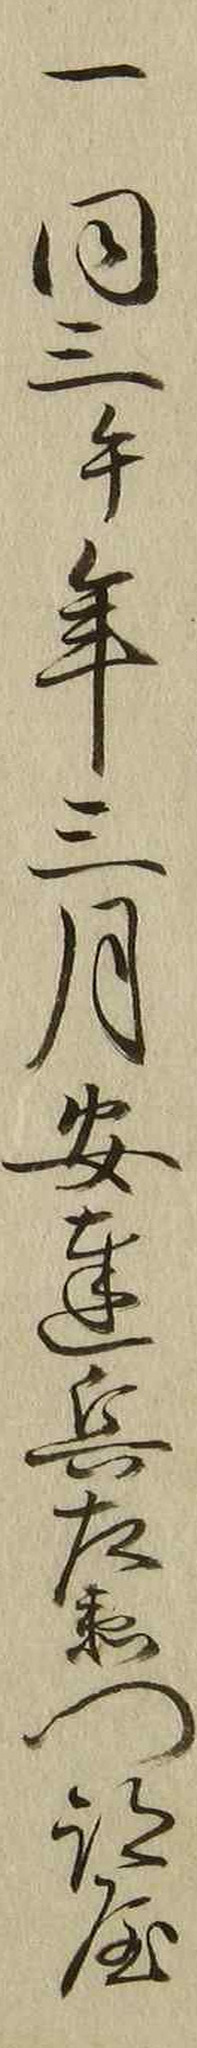一同三午年三月安達兵左衛門跡屋
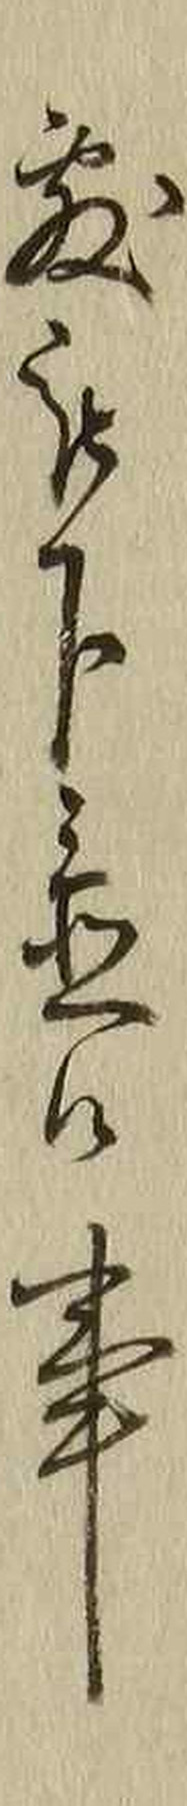敷被下置候事
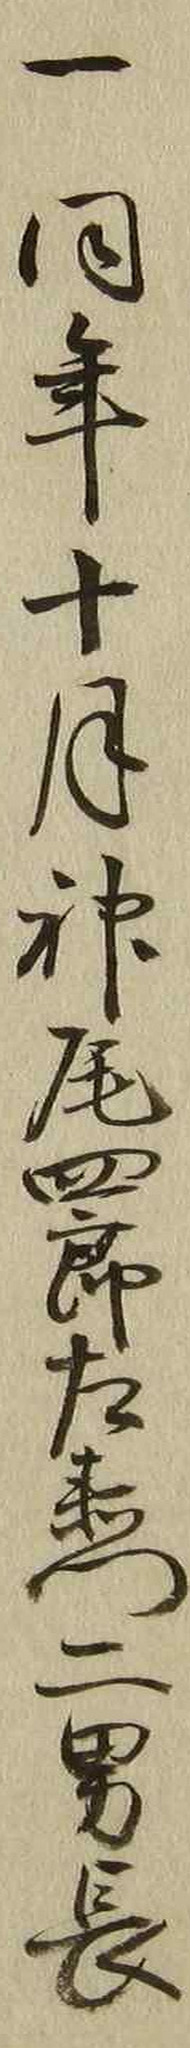一同年十月神尾四郎左衛門二男長
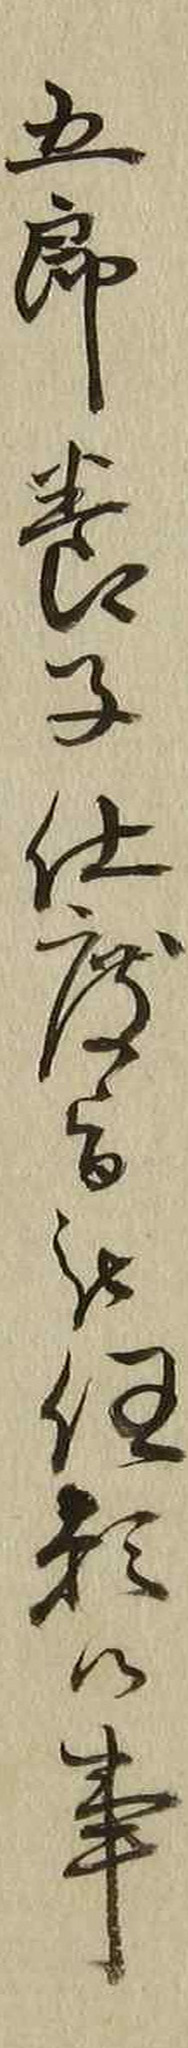五郎養子仕度旨被任願候事
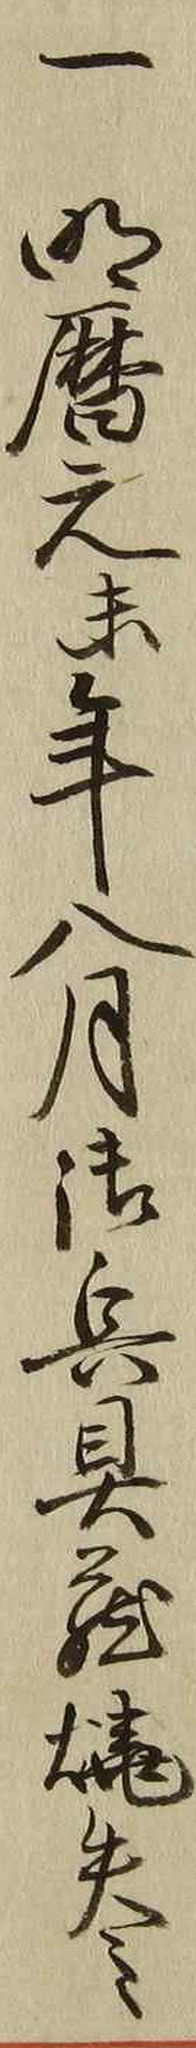一明暦元未年御兵具蔵焼失之
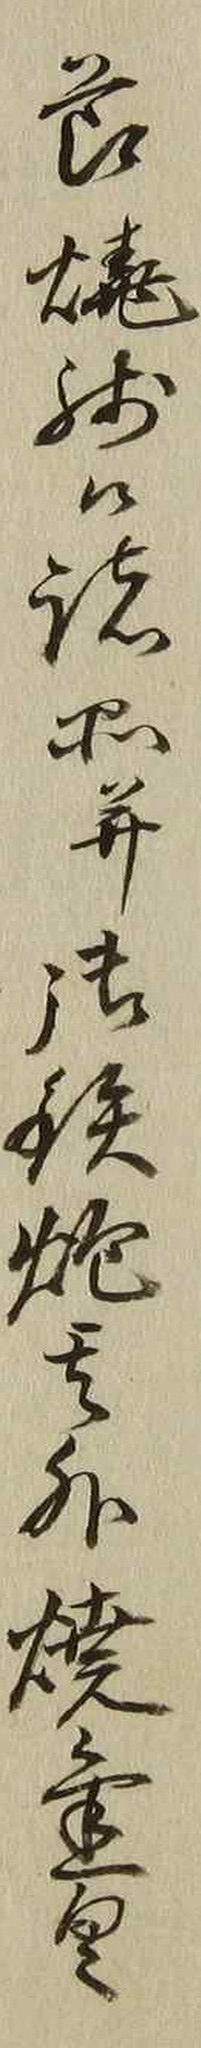節焼残候諸品幷御鉄炮其外焼金具
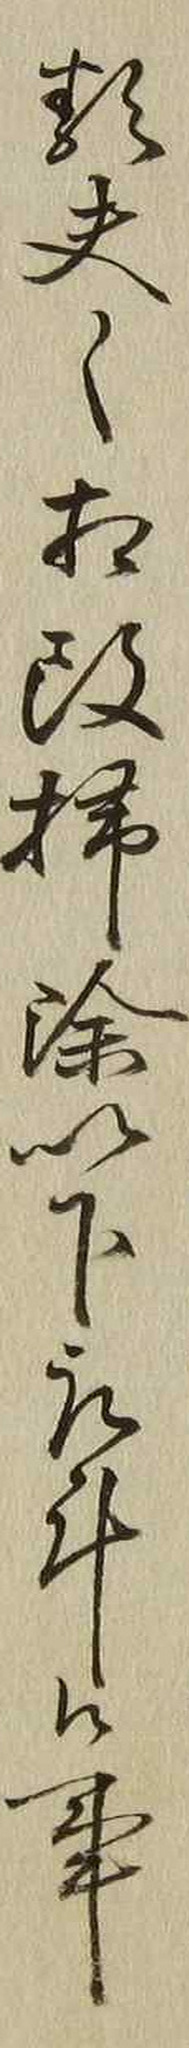類夫々相改掃除以下被計候事
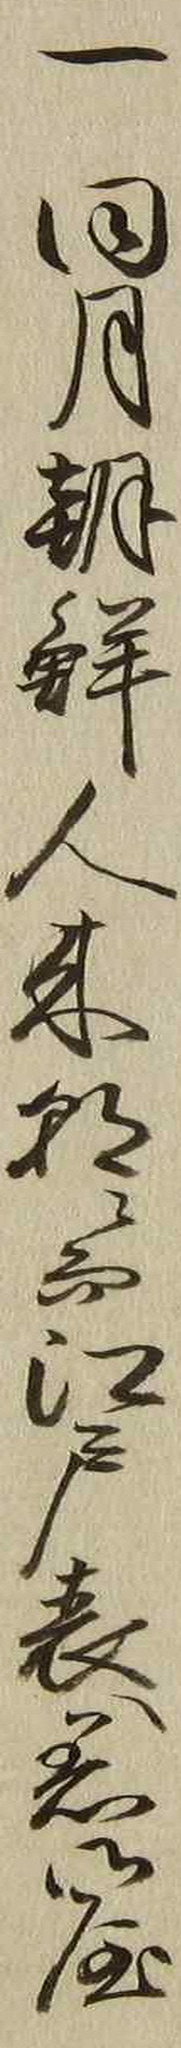一同月朝鮮人来朝ニ而江戸表へ着御屋
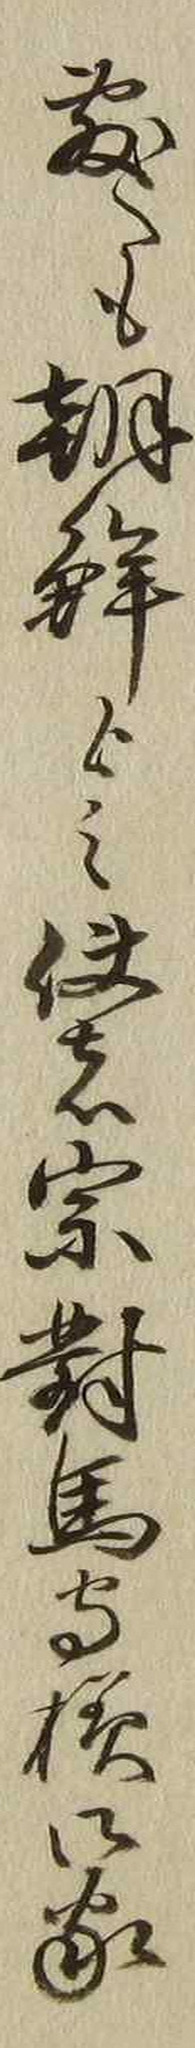敷へも朝鮮ゟ之使者宗対馬守様御家
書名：諸士系譜　巻之60　と之部3
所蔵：会津若松市立会津図書館
